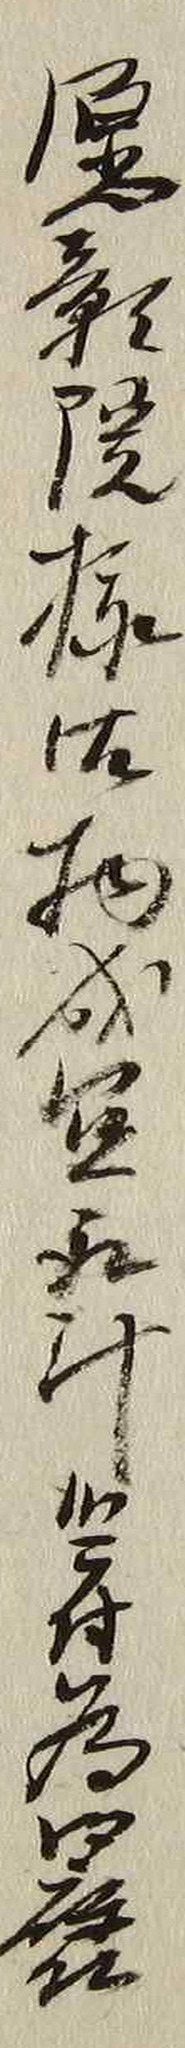愿彰院様御物成宜取計候付為御褒
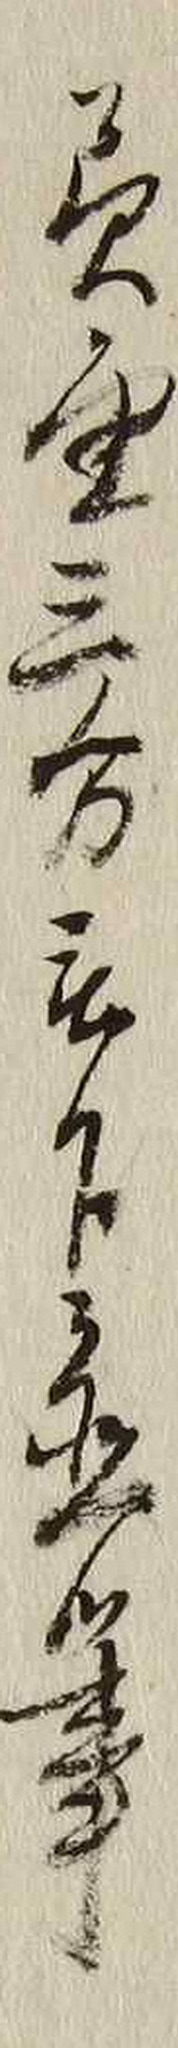美金三分被下置候事
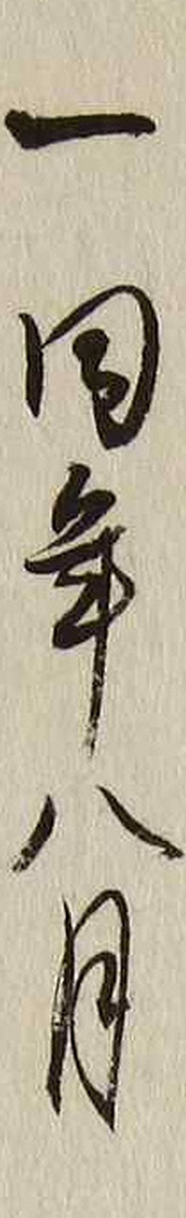一同年八月
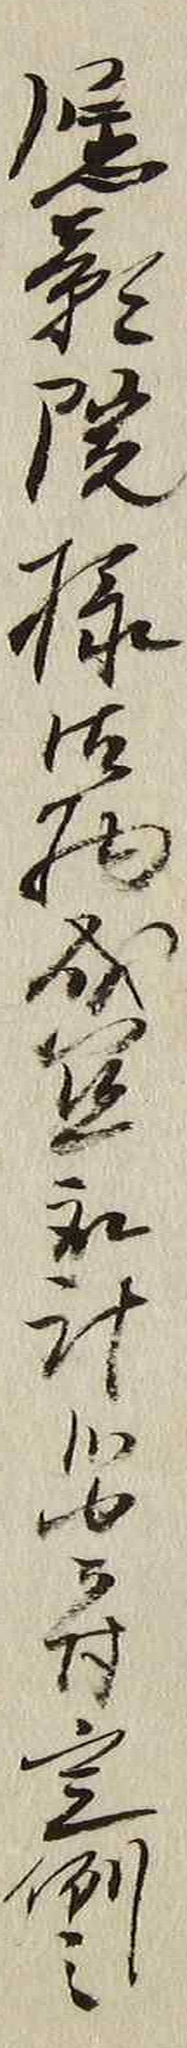愿彰彰院様御物成宜取計候由付定例之
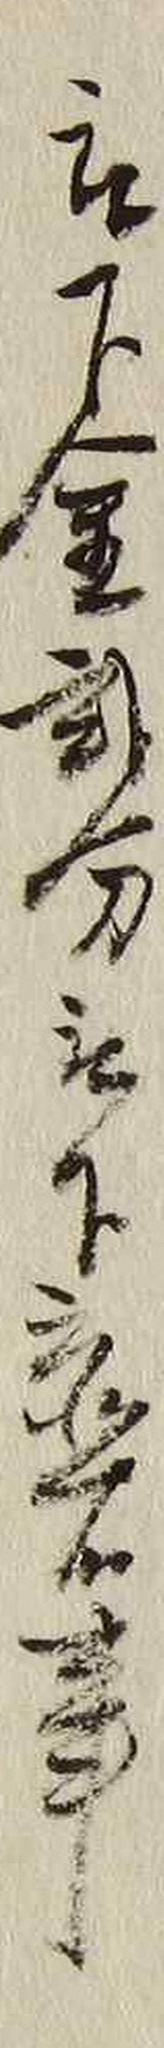被下金弐分被下置候事
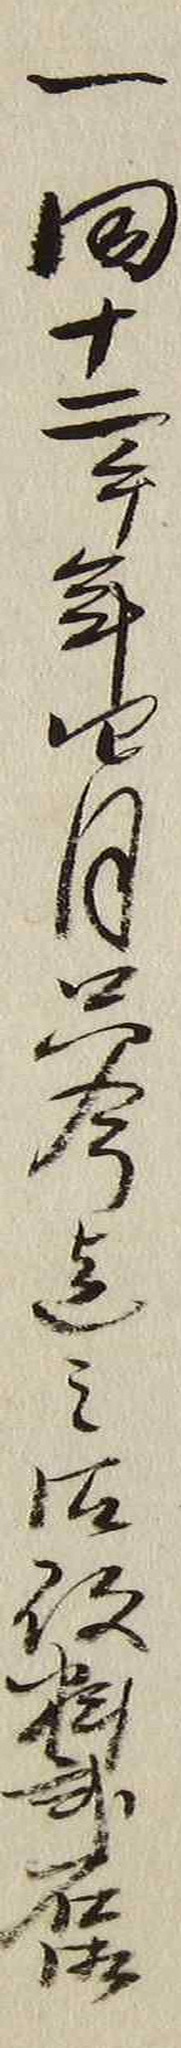一同十二午年四月只今迄之御役料弐石御
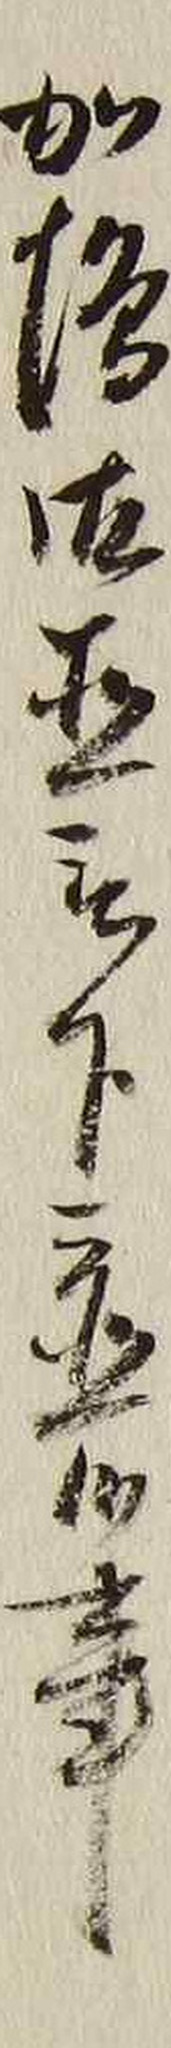加増御直被下置候事
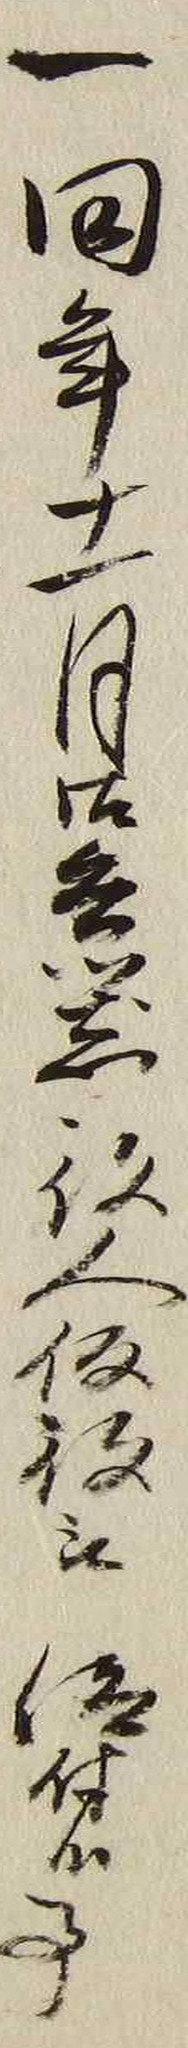一同年十一月御兵器役人仮役被仰付候事
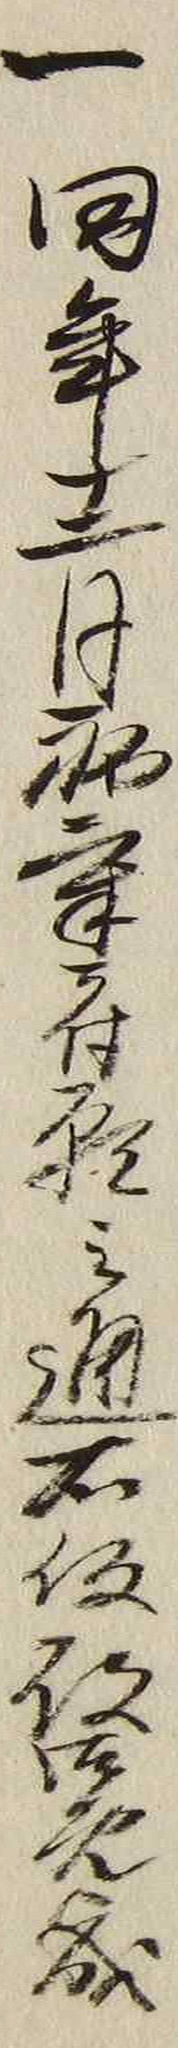一同年十二月病気付願之通右仮役御免被成

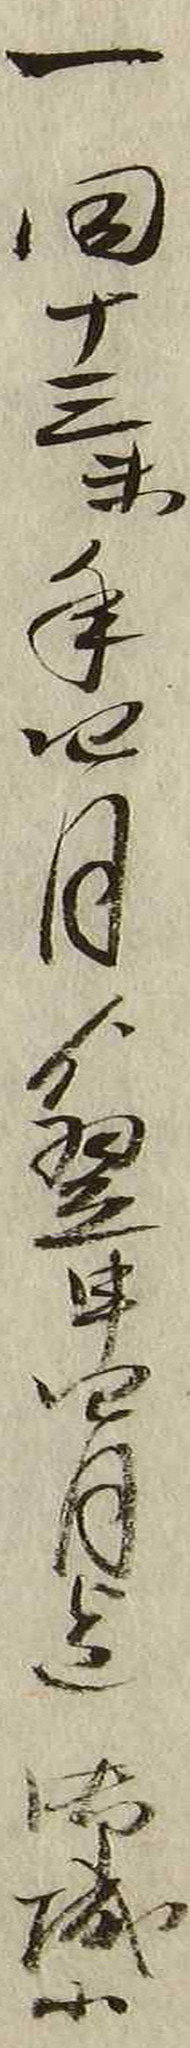一同十三未年四月ゟ翌申四月迄御城小
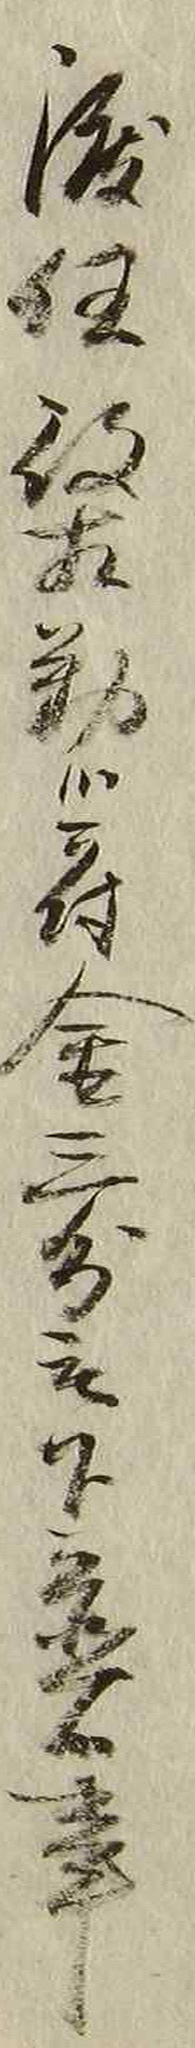渡任役相勤候付金三分被下置候事
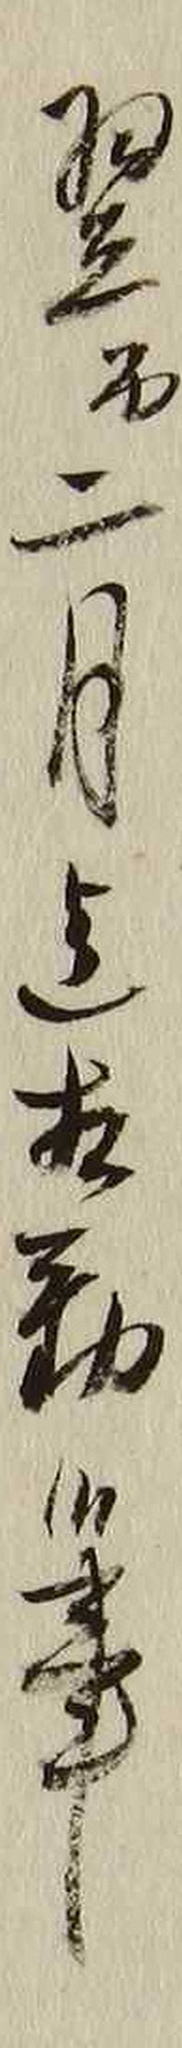翌酉二月迄相勤候事
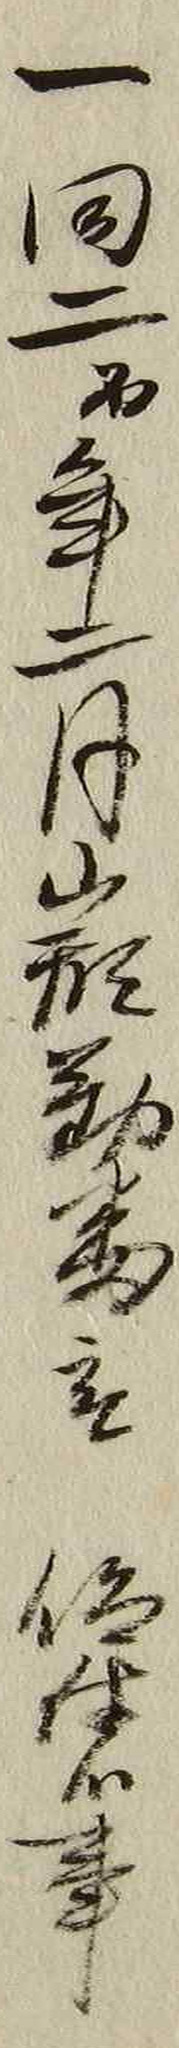一同二酉年二月山形勤番被仰付候事
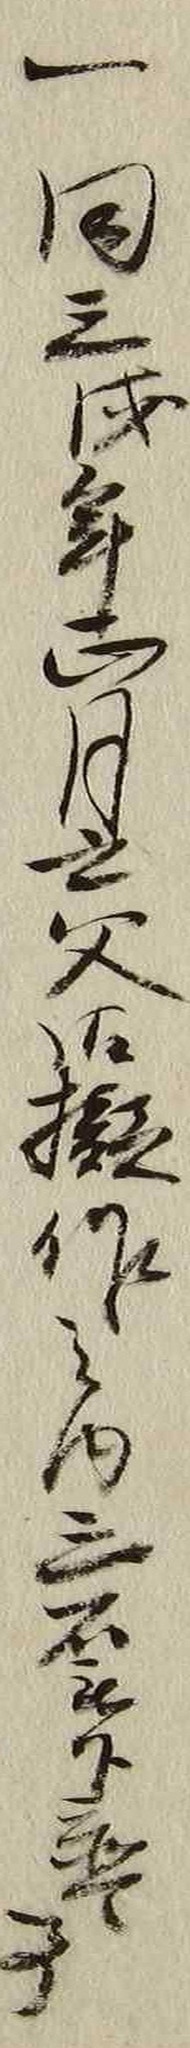一同三戌年正月亡父御擬作之内三石被下置候事
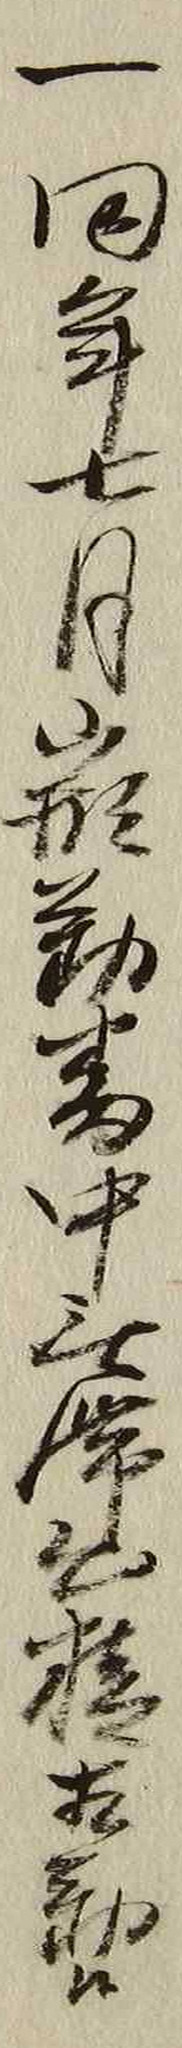一同年七月山形勤番中無滞出精相勤候
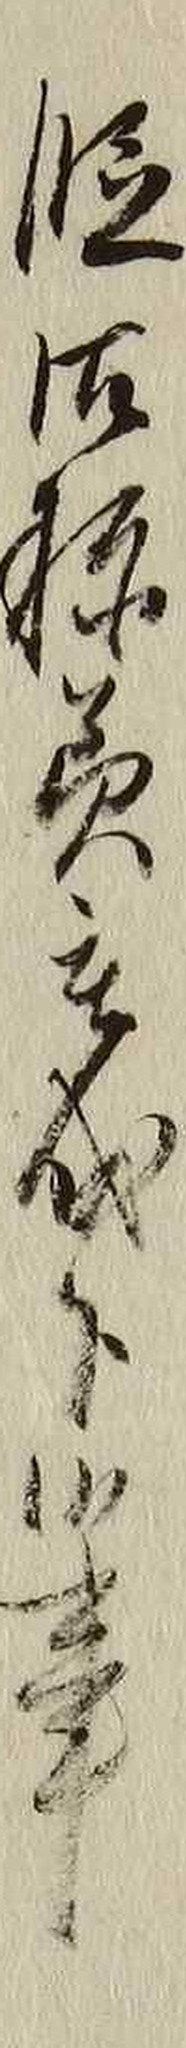段御称美被成下候事
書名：諸士系譜　巻之350　せ之部1冊全
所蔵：会津若松市立会津図書館
